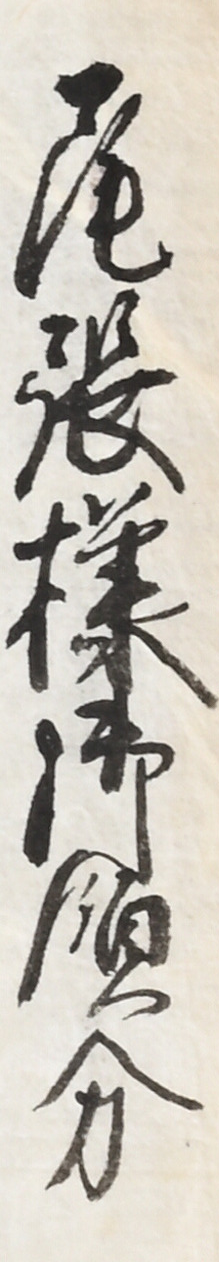尾張様御領分
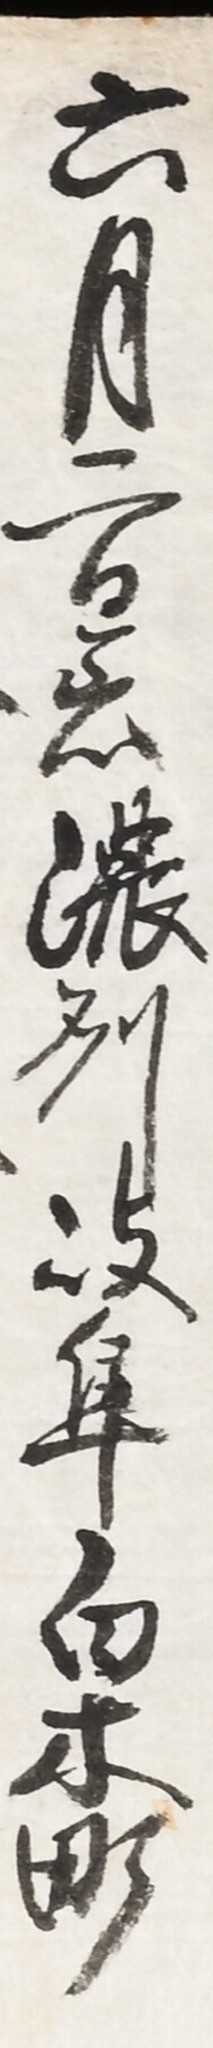六月二日着濃州岐阜白木町
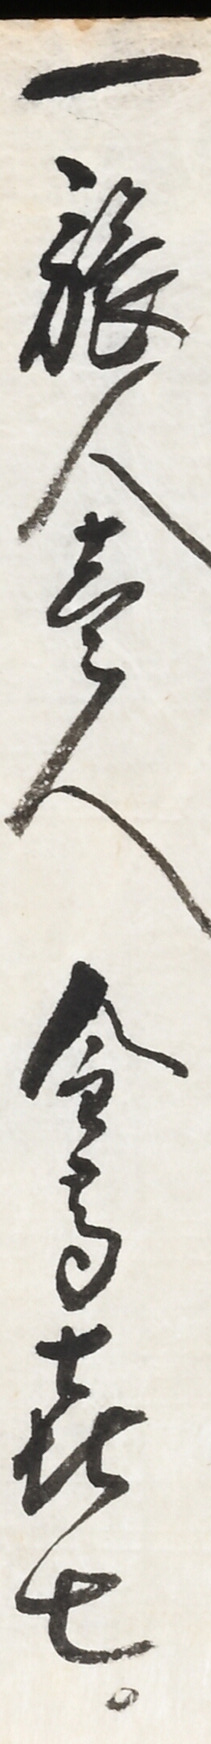一旅人壱人金高喜七
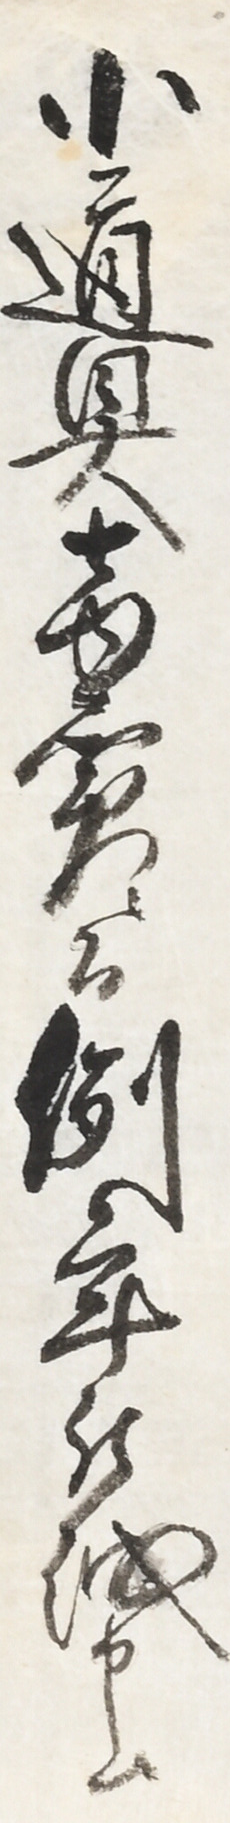小道具商売ニ而例年罷越申候
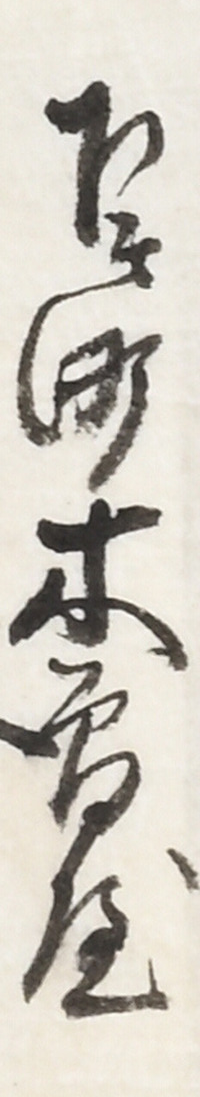下モ町木曽屋
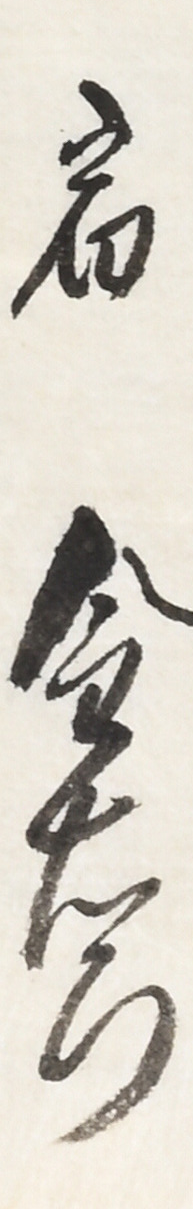宿金右衛門
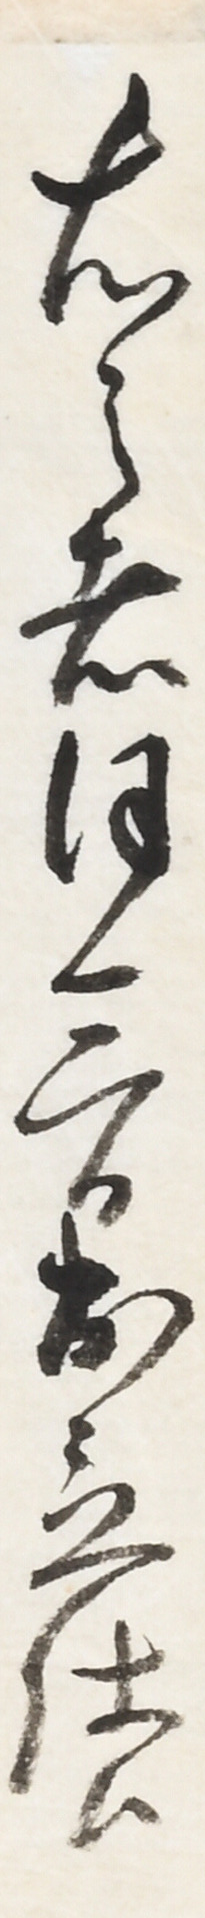右之者同三日出立仕候
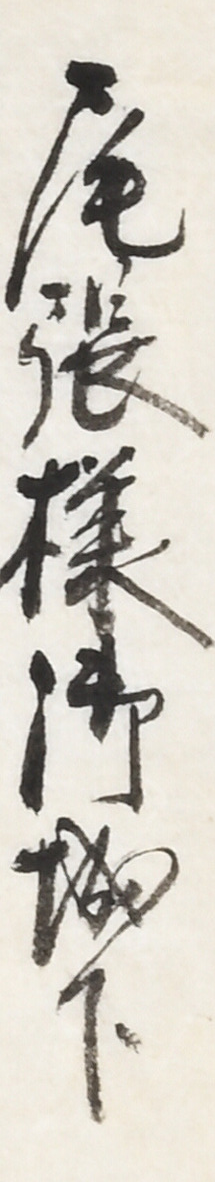尾張様御城下
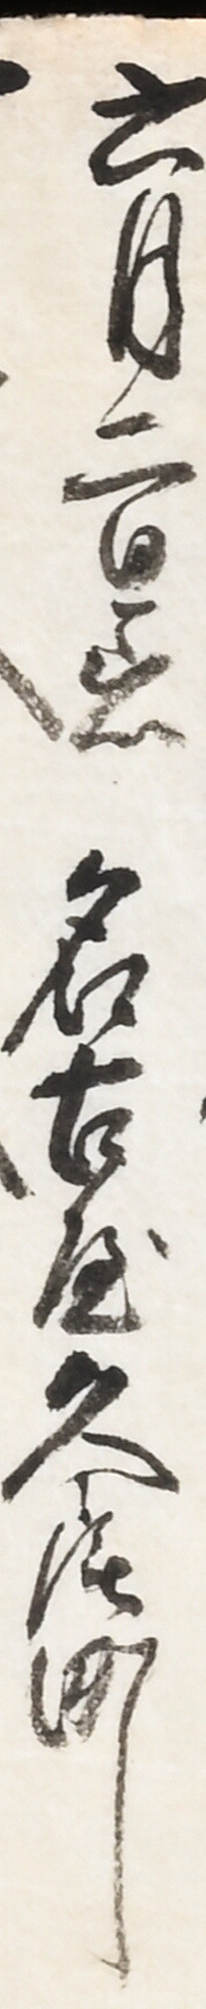六月二日着名古屋久屋町
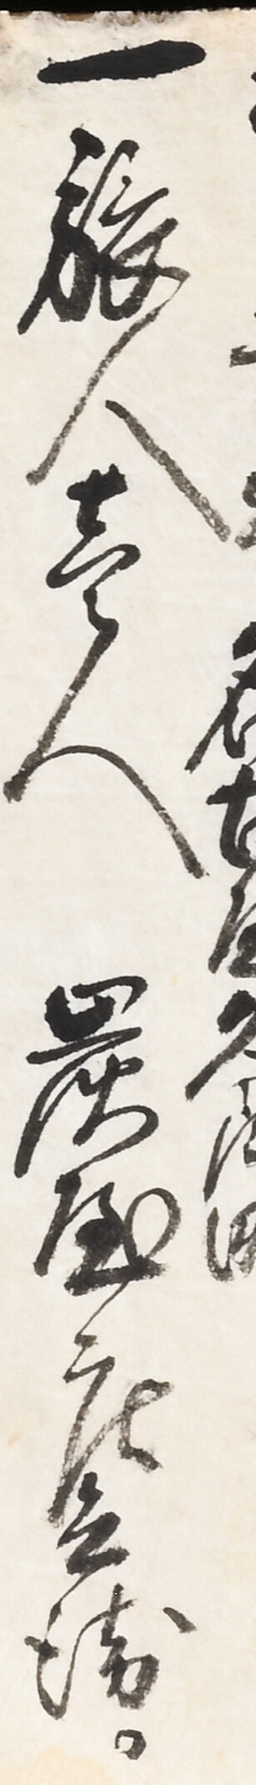一旅人壱人炭屋庄兵衛〇
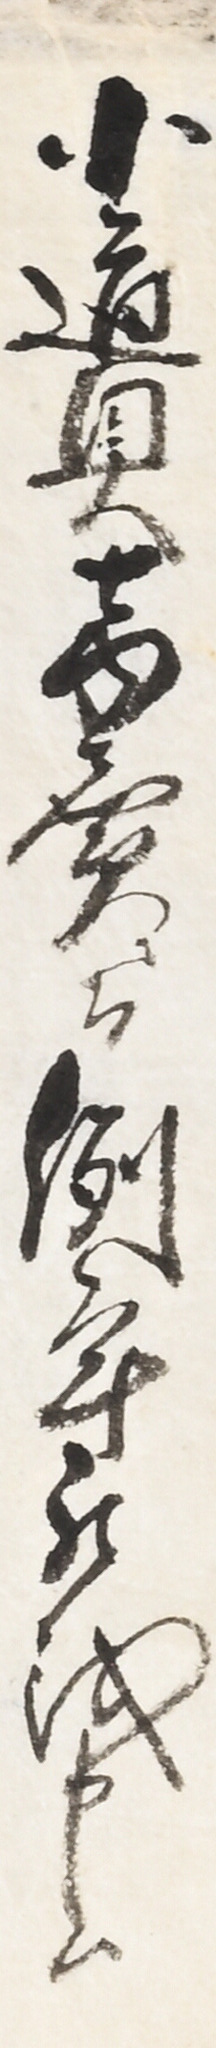小道具商売ニ而例年罷越申候
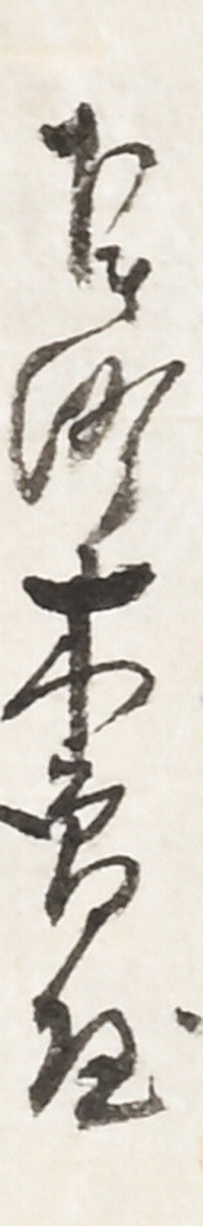下モ町木曽屋
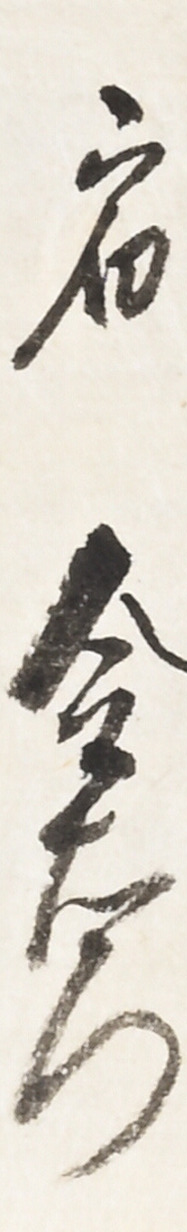宿金右衛門
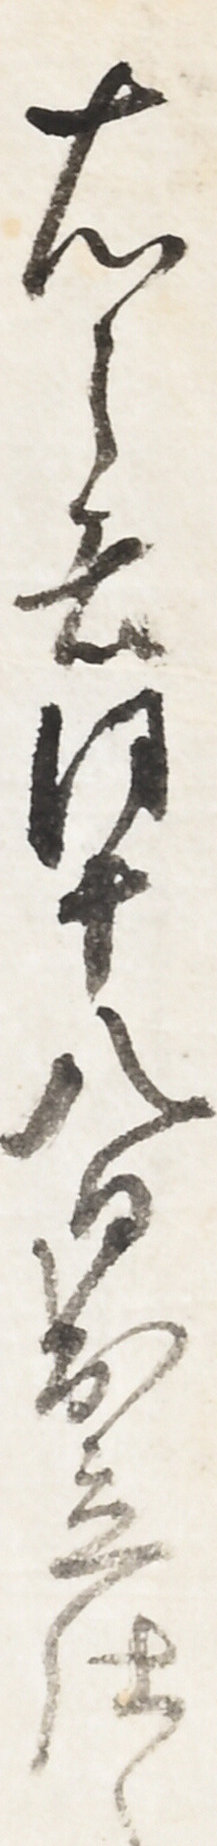右之者同十八日出立仕候
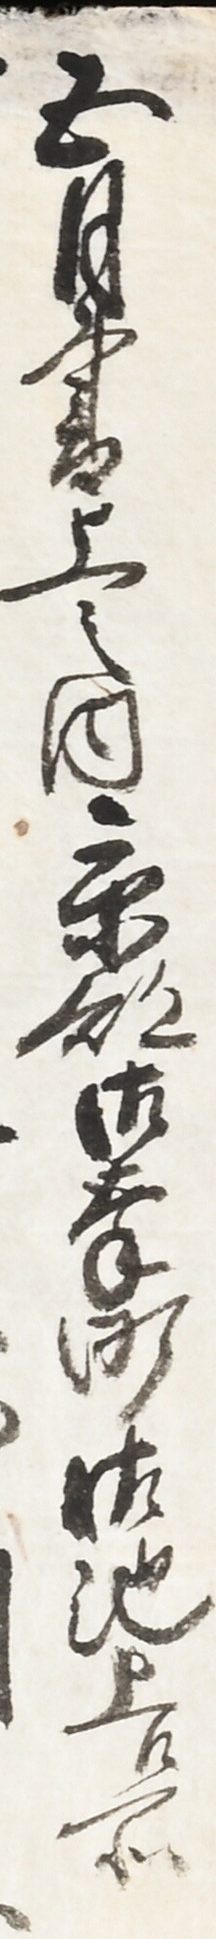五月書上之内京都御幸町御池上ル所
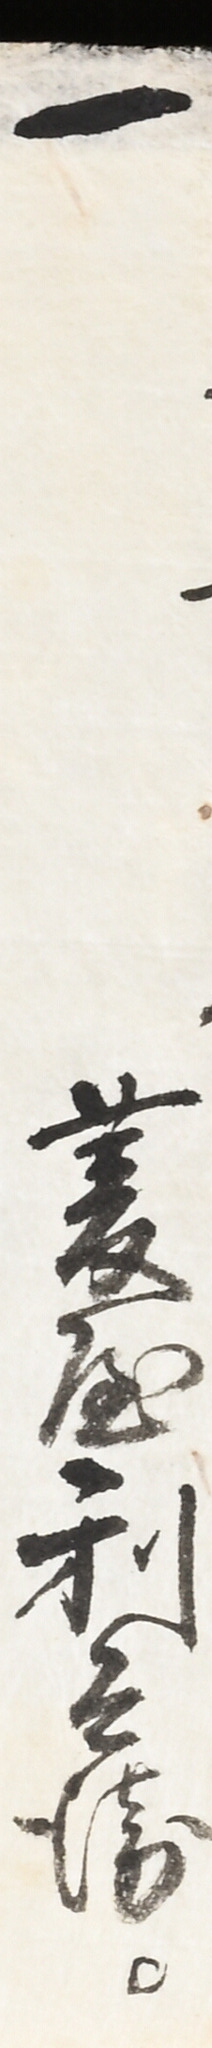一菱屋利兵衛〇
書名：旅人泊控帳
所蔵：伊那市立高遠町図書館・合同会社AMANE
